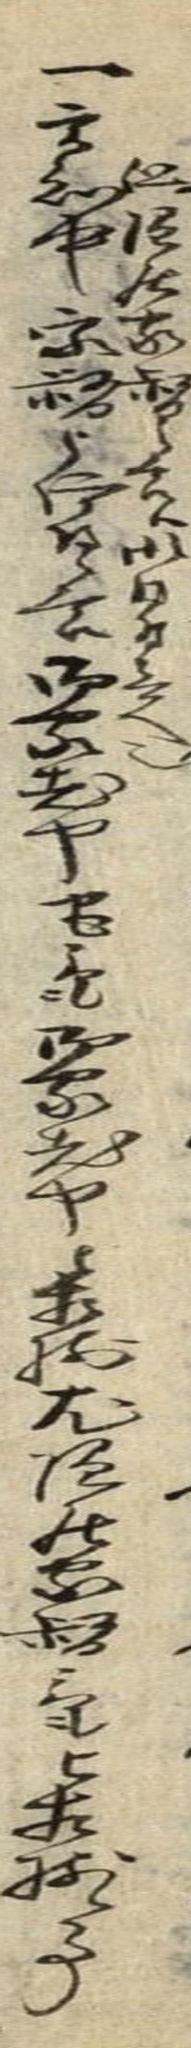一高知中家督被仰付候節御家老中宅に而も御家老中被相揃尤隠居家督に而も被相揃候事
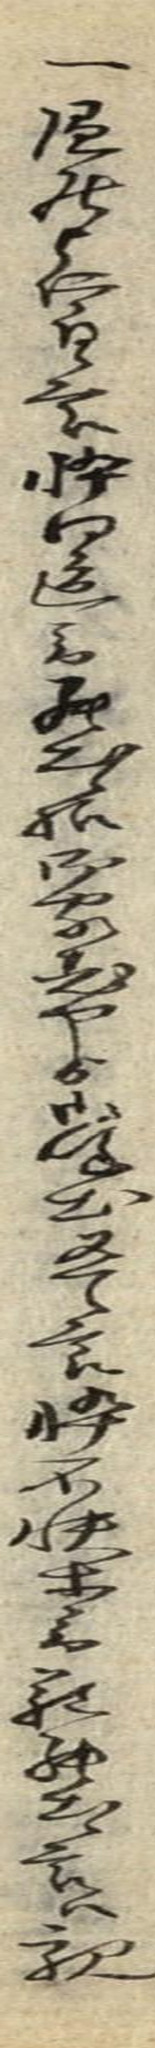一隠居被仰付候節忰同道に而罷出候様御家老中ゟ御呼出有之候節忰不快等に而難罷出候節は親
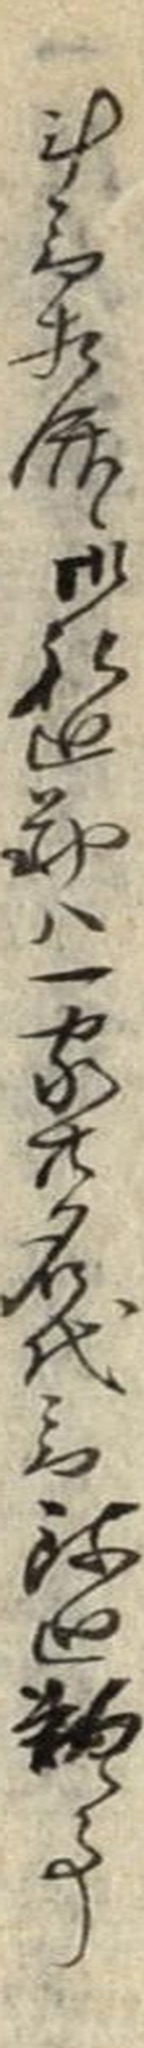斗に而相済候御礼廻勤は一家共名代に而致廻勤候事
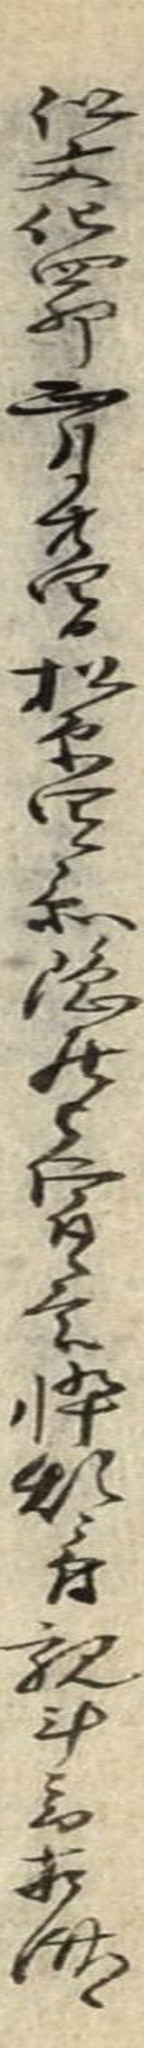但文化四卯正月廿四日松原四郎兵衛隠居被仰付候節忰煩候に付親斗に而相済候
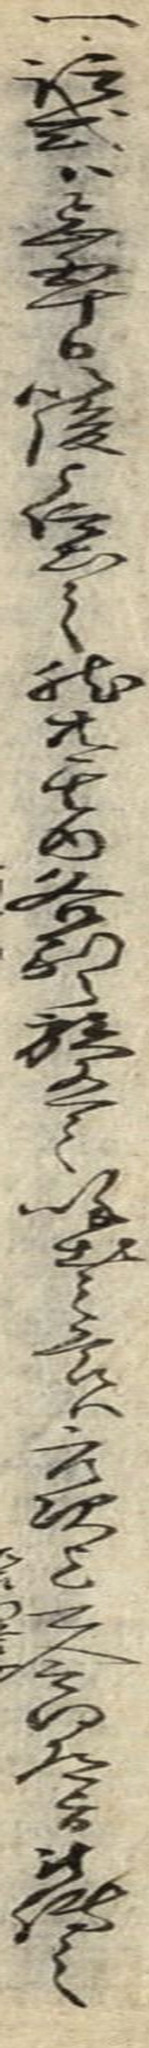一跡式は忌五十日以後被仰出之然共其内格別之族有之呼出候節は取次迄可令同道旨被伝之
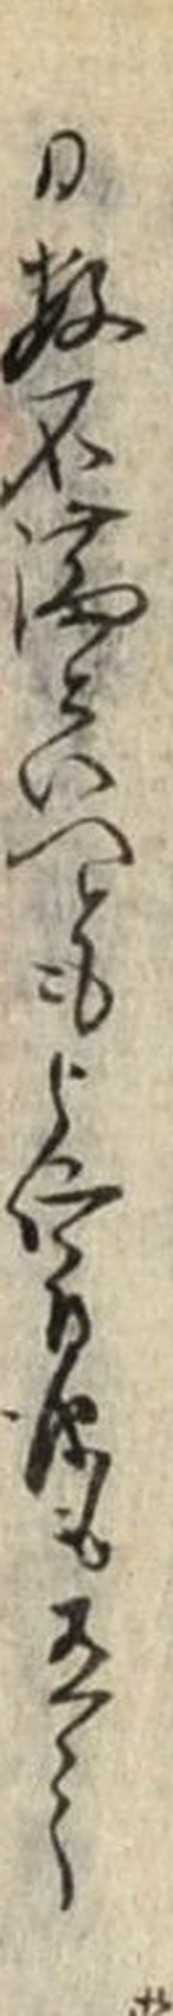日数不満といへとも被仰付候儀も有之
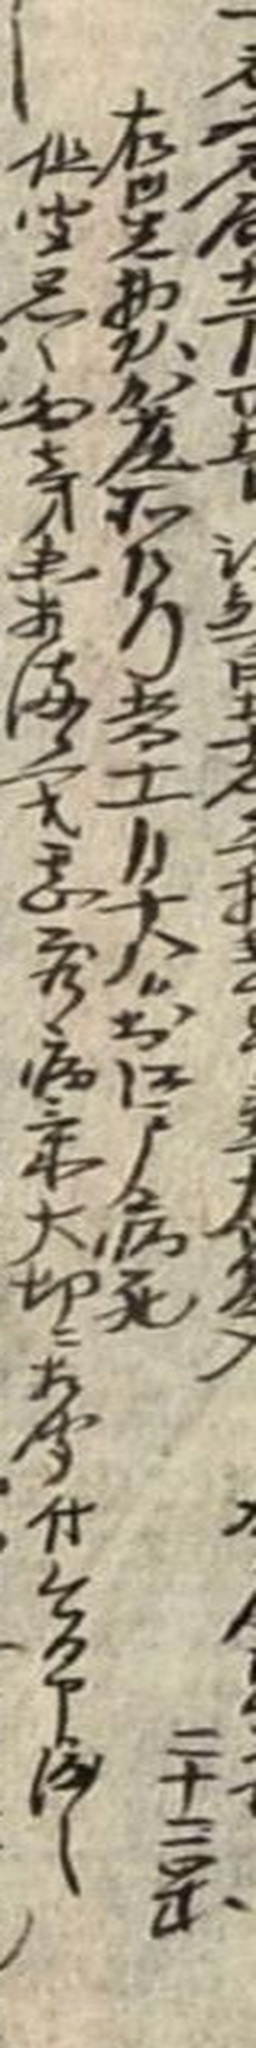但聞忌之次第未相伝候へ共甚蔵病気大切に相聞候に付今日申渡之
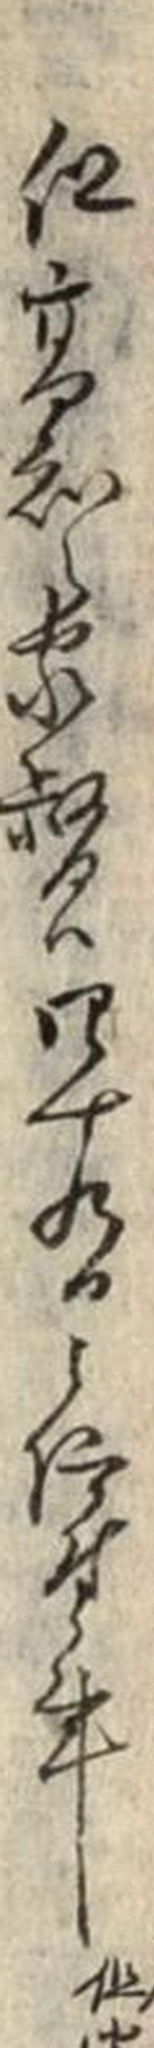但高知之家督は四十九日被仰付候事
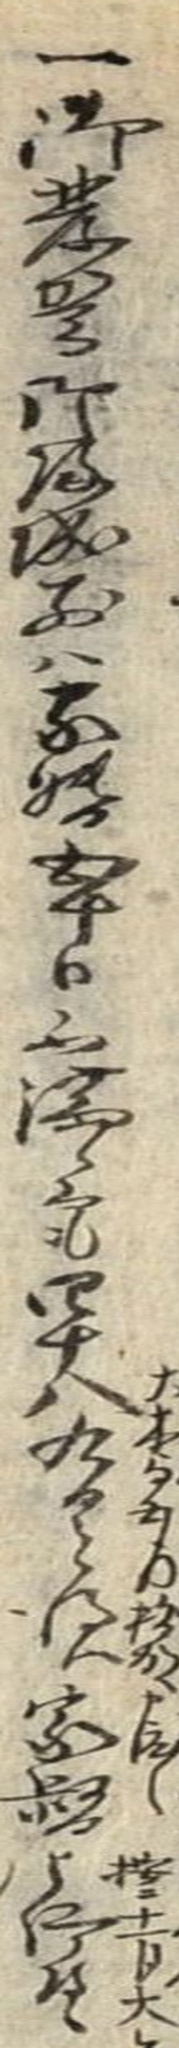一御発駕御帰城前は家督五十日不満候而も四十八日に候得は家督被仰付候
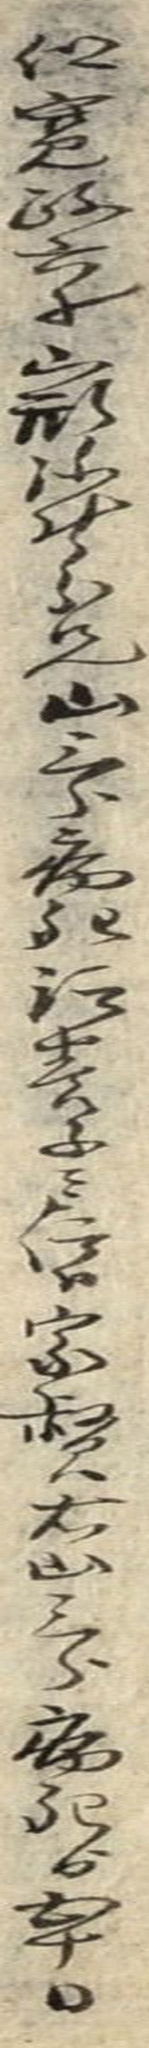但寛政六寅山形弥次郎兄山三郎病死跡養子に被仰付家督は右山三郎病死ゟ五十日
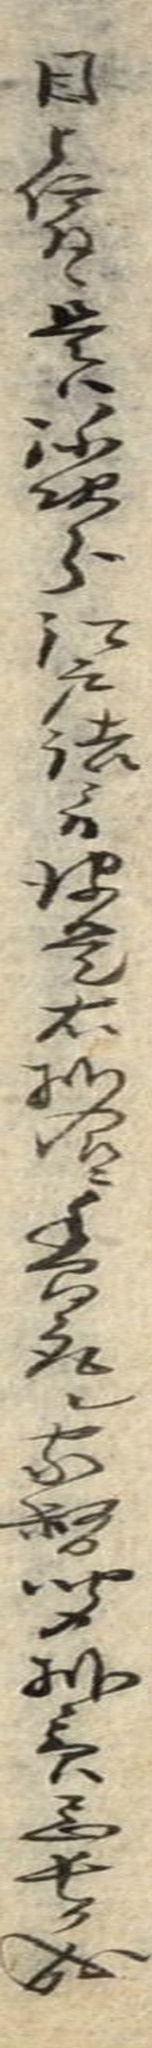目被仰付候是は弥次郎江戸詰に付彼是右掛合に手間取し家督聞掛に而は忌長く成
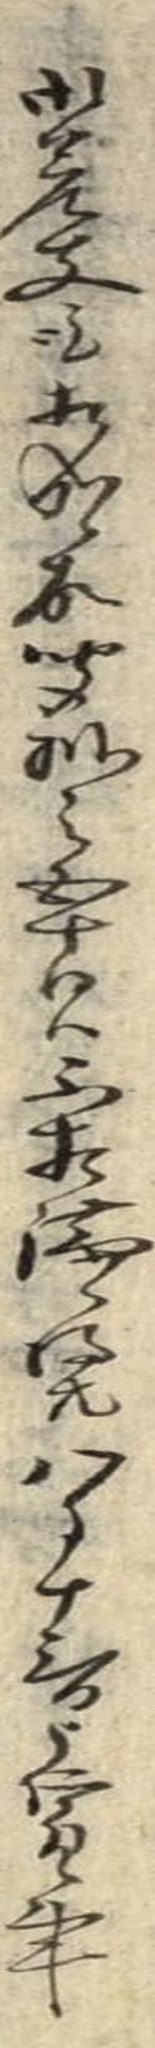御差支にも相成候故聞掛之五十日は不相満候得共八月十三日被仰付候事
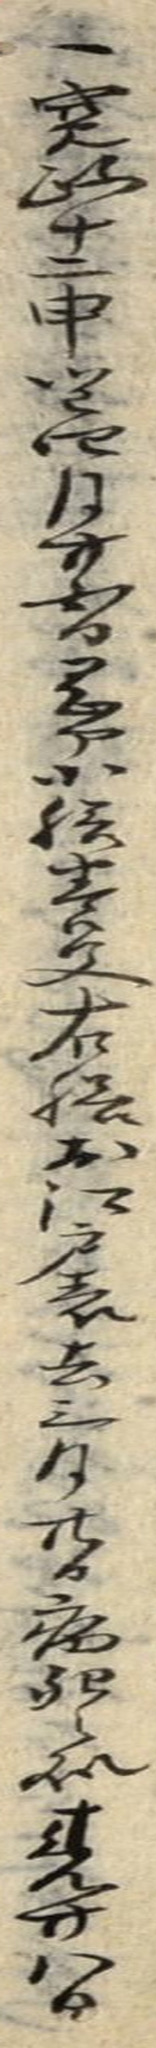一寛政十二申閏四月廿五日岡部小膳養子右膳於江戸表去三月廿日候処来る廿八日

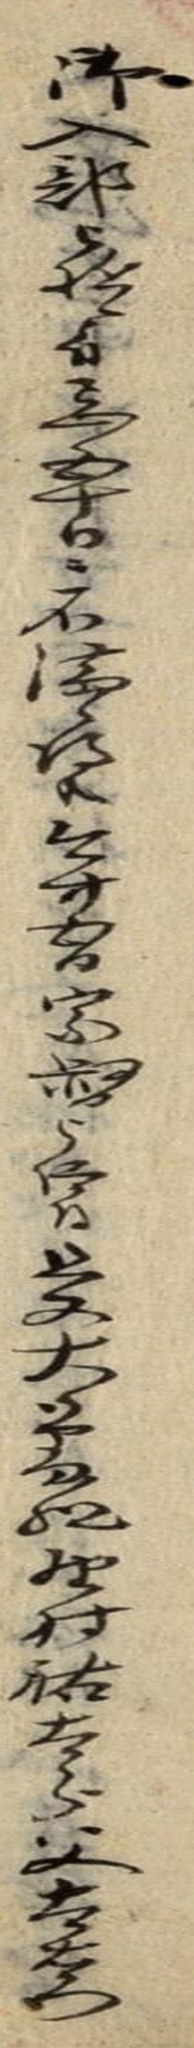御入部被遊候に付忌五十日に不満候得共今廿五日家督被仰付且又大御番組野村祐太郎父太右衛門
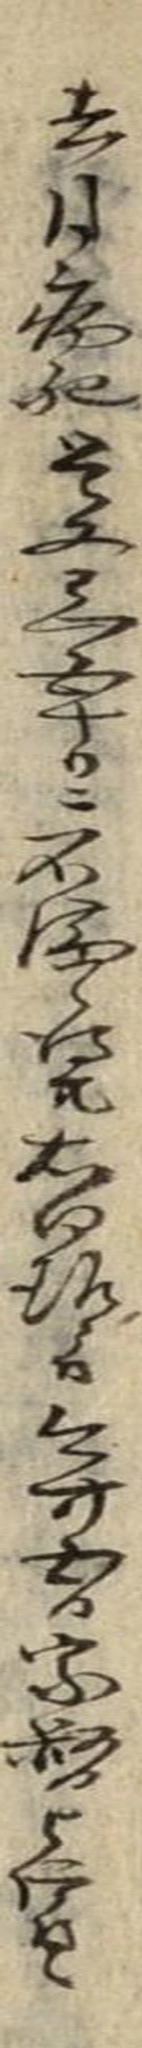去月病死是又忌五十日に不満候得共右同趣に付今廿五日家督被仰付候
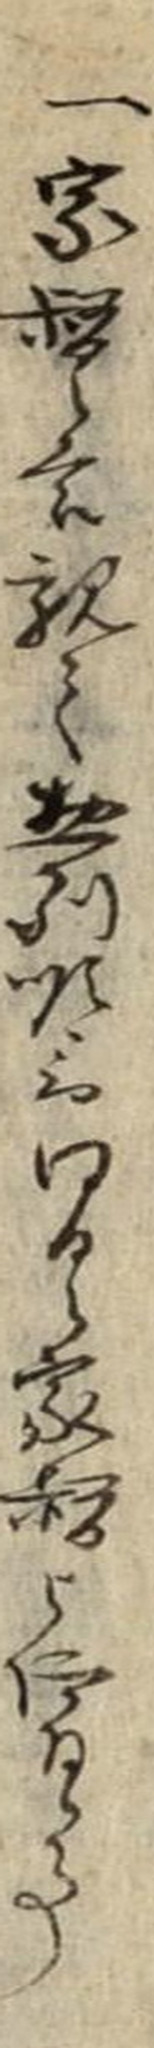一家督之節親之惣列順に而同日之家督被仰付候事
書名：御用并被仰出之部
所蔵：福井県文書館 Fukui Prefectural Archives
